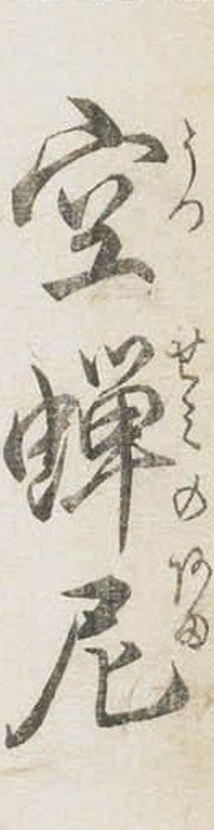空蝉尼
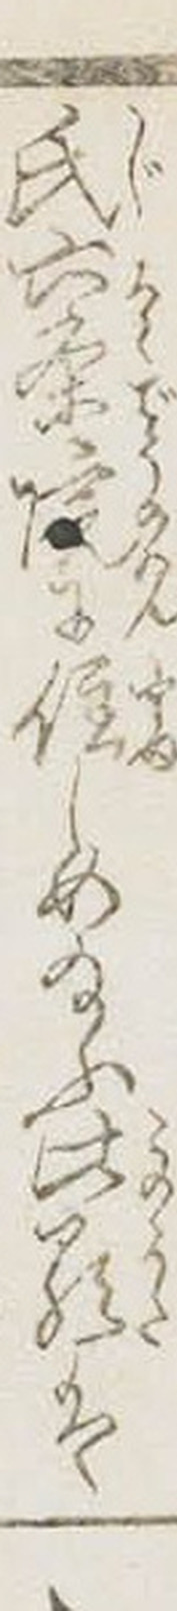氏六条院に住しめ給ふ此歌は
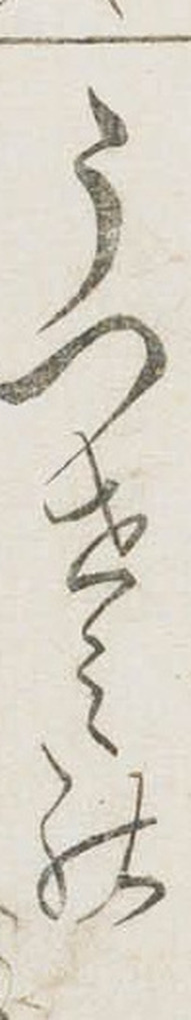うつせみの
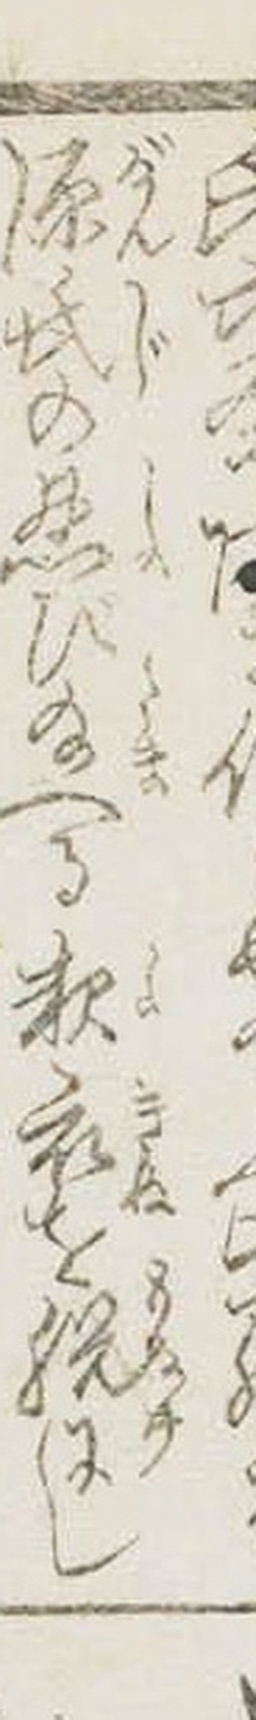源氏の忍び給へる夜衣を脱にし
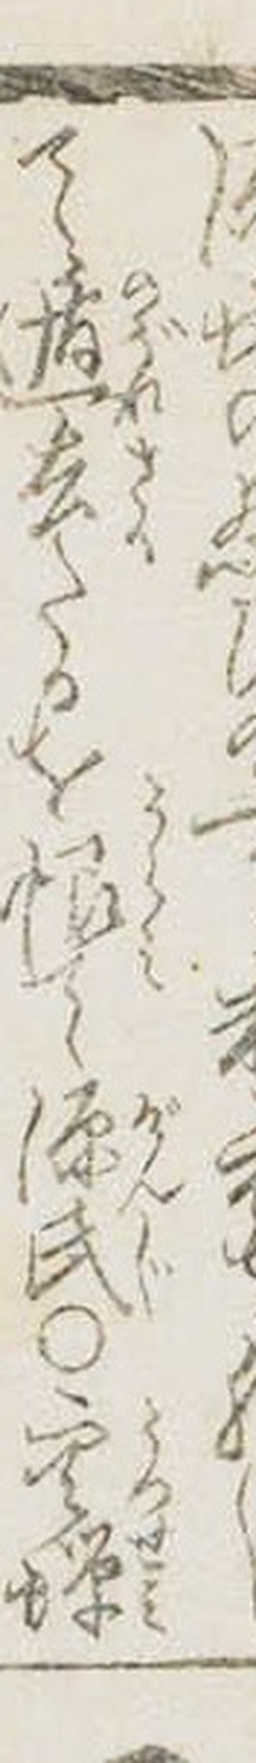て遁去たるを恨て源氏○空蝉
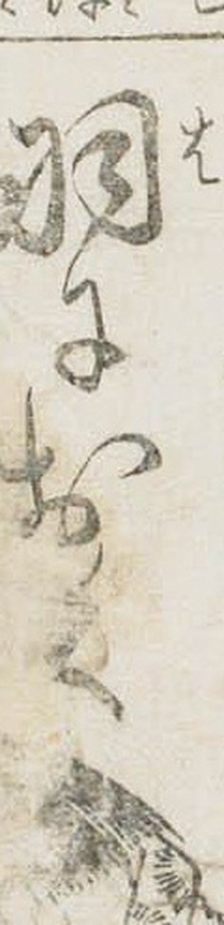羽におく
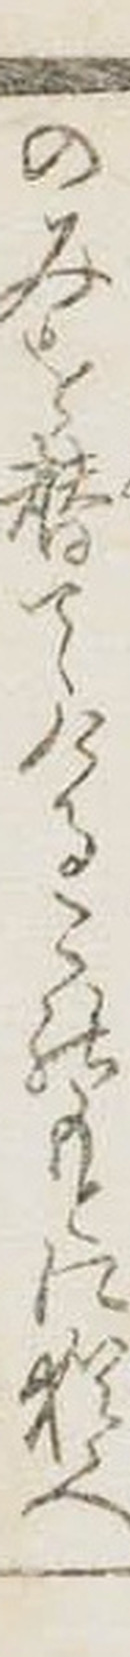のみを替てけるこのもとに猶人
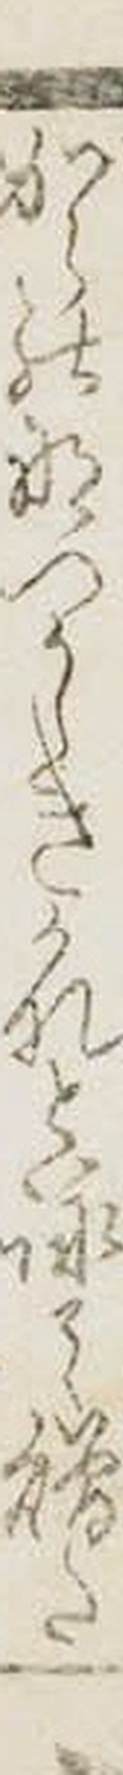がらのなつかしきかなと詠て贈た
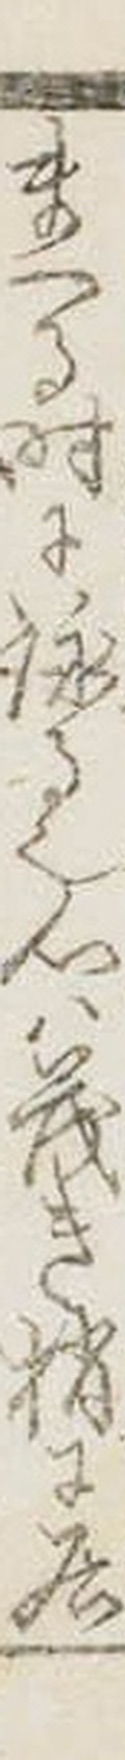まへる時に詠る也心は茂き梢に居
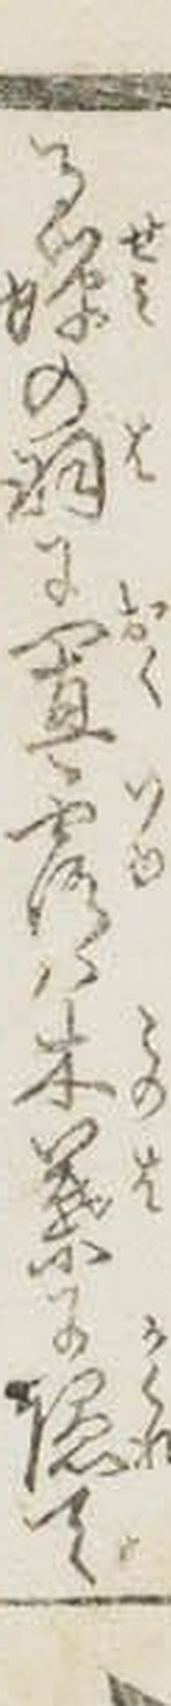る蝉の羽に置露は木葉に隠て
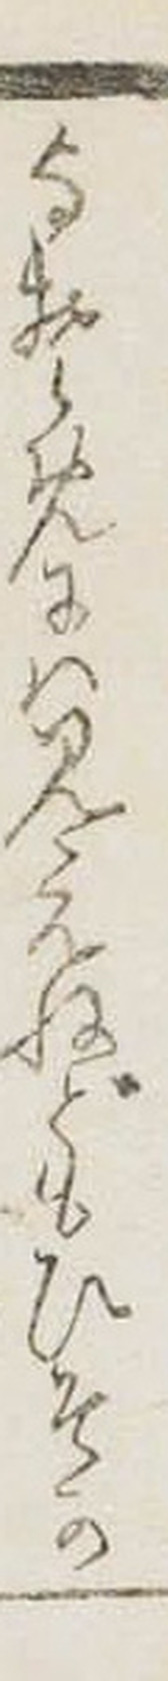よそめには見えねどもひそか
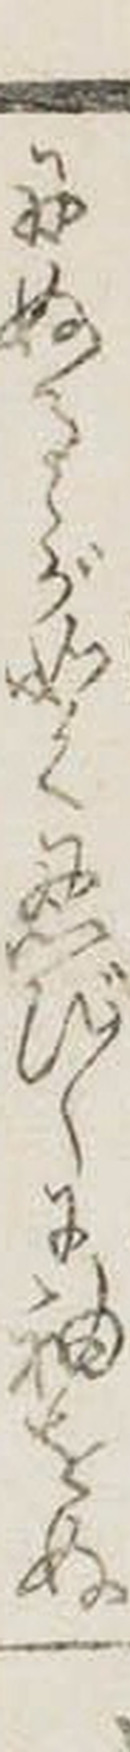にぬるゝが如く忍び〳〵に袖をぬ
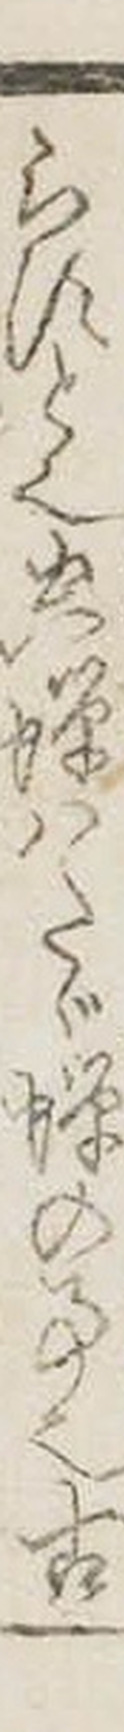らすと也空蝉はたゞ蝉の事也古
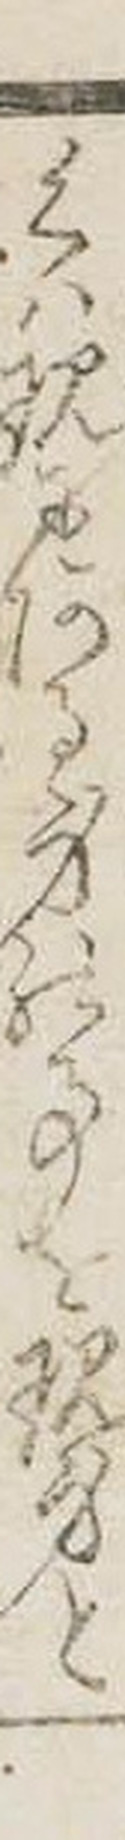くは現にある身の事を現身と
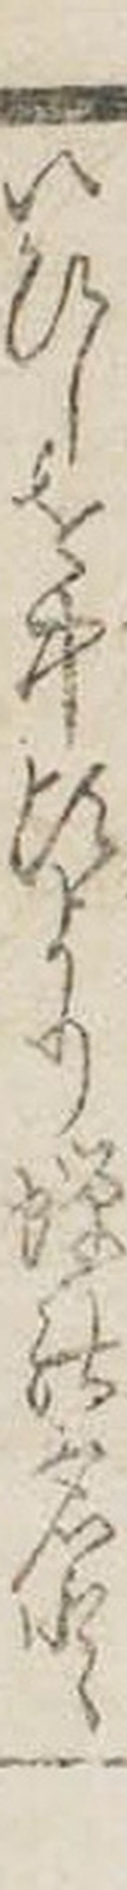いひしを中頃より蝉の名と

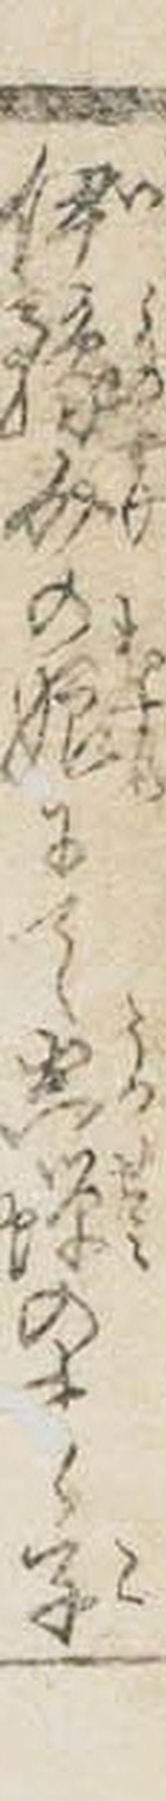伊予介の娘にて空蝉のまゝ子
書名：源氏百人一首
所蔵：東京学芸大学教育コンテンツアーカイブ
